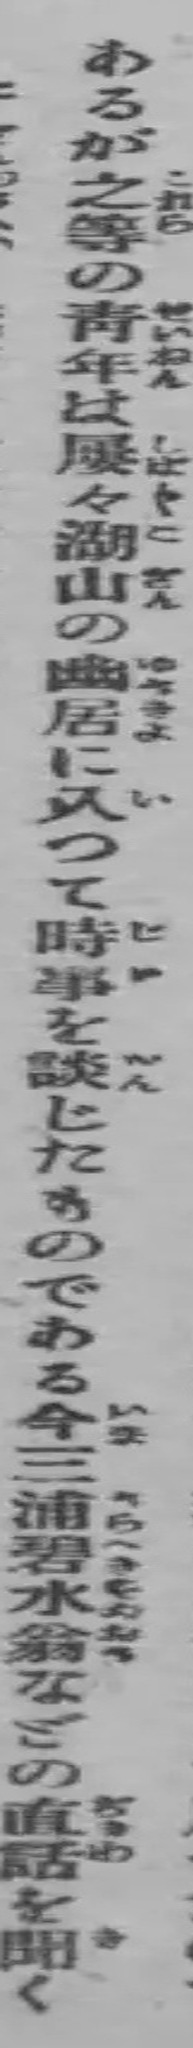あるが之等の青年は屡々湖山の幽居に入つて時事を談じたものである今三浦碧水翁などの直話を聞く
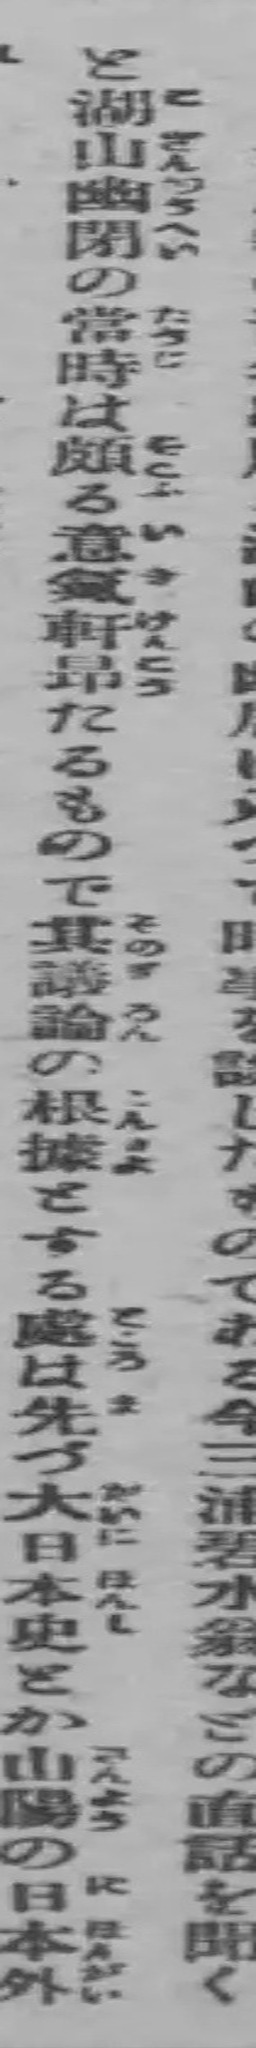と湖山幽閉の当時は頗る意気軒昂たるもので其議論の根拠とする処は先づ大日本史とか山陽の日本外
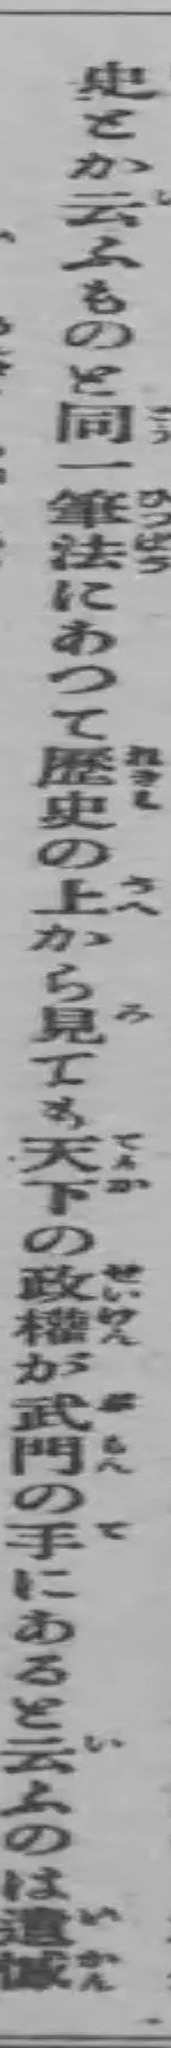史とか云ふものと同一筆法にあつて歴史の上から見ても天下の政権が武門の手にあると云ふのは遺憾
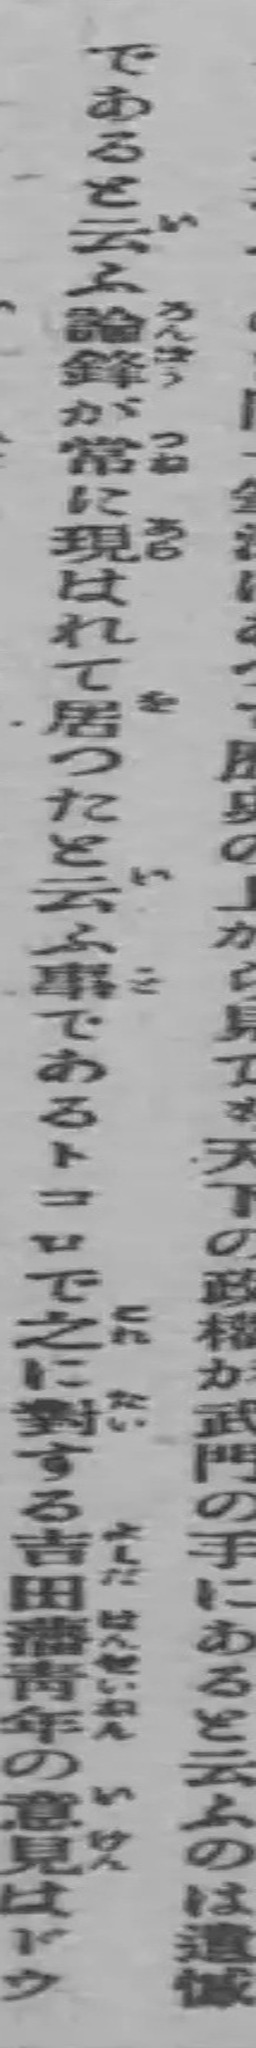であると云ふ論鋒が常に現はれて居つたと云ふ事であるトコロで之に対する吉田藩青年の意見はドウ
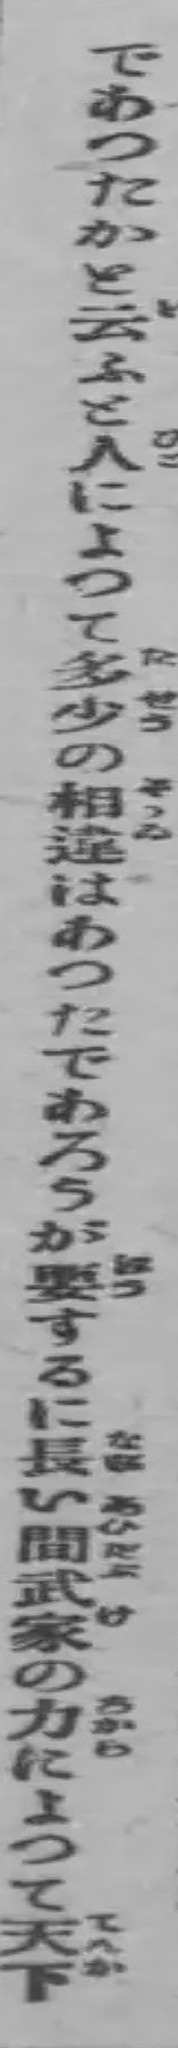であつたかと云ふと人によつて多少の相違はあつたであろうが要するに長い間武家の力によつて天下
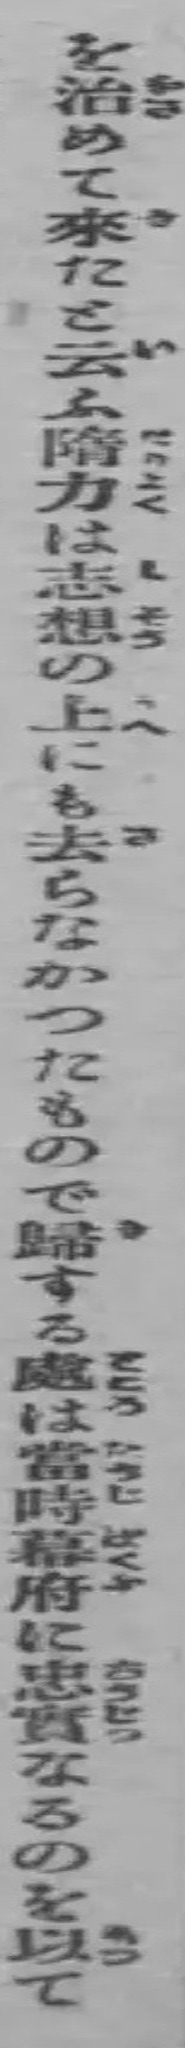を治めて来たと云ふ隋力は志想の上にも去らなかつたもので帰する処は当時幕府に忠実なるのを以て
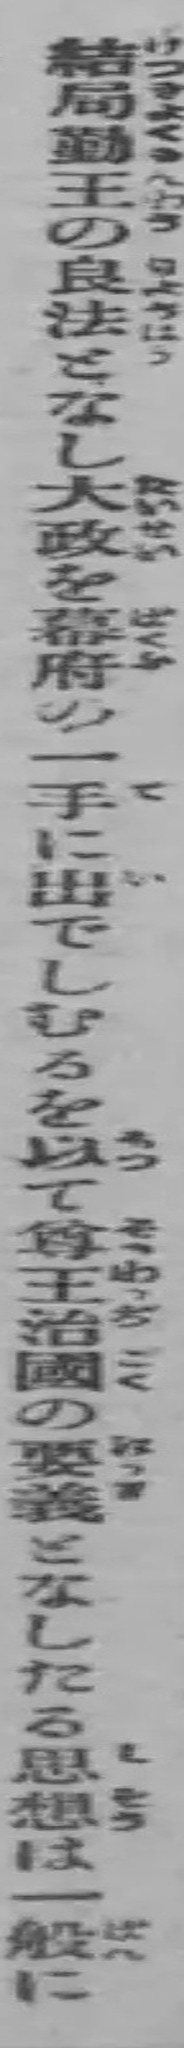結局勤王の良法となし大政を幕府の一手に出でしむるを以て尊王治国の要義となしたる思想は一般に
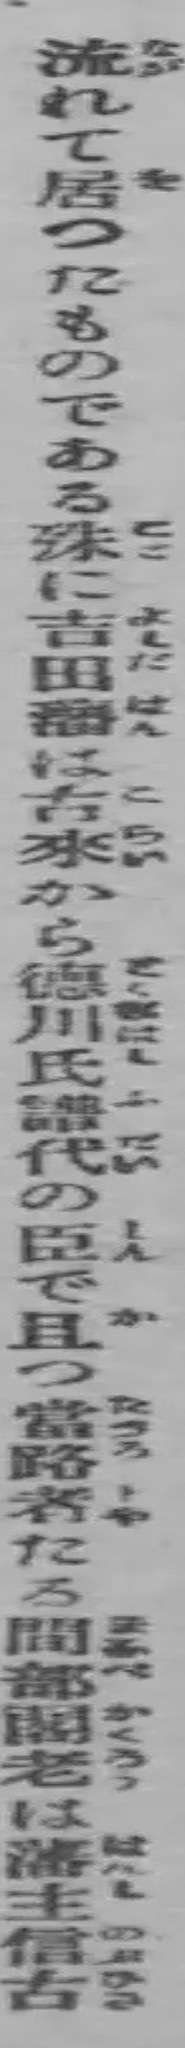流れて居つたものである殊に吉田藩は古来から徳川氏譜代の臣で且つ当路者たる間部閣老は藩主信古
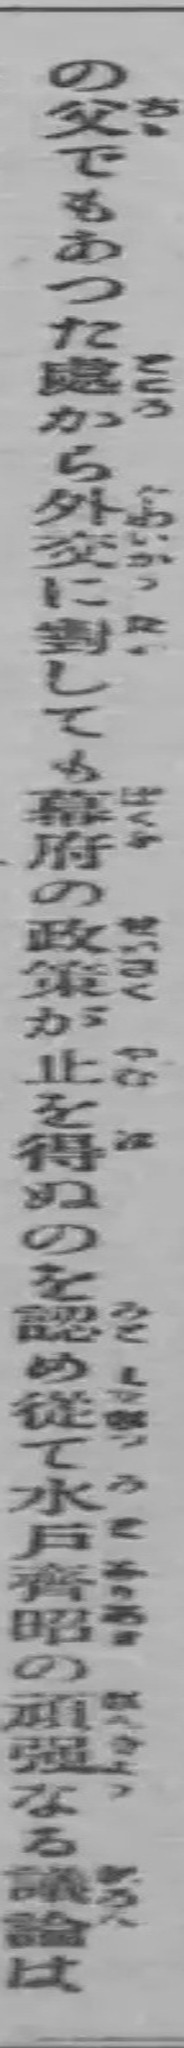の父でもあつた処から外交に対しても幕府の政策が止を得ぬのを認め従て水戸斉昭の頑強なる議論は
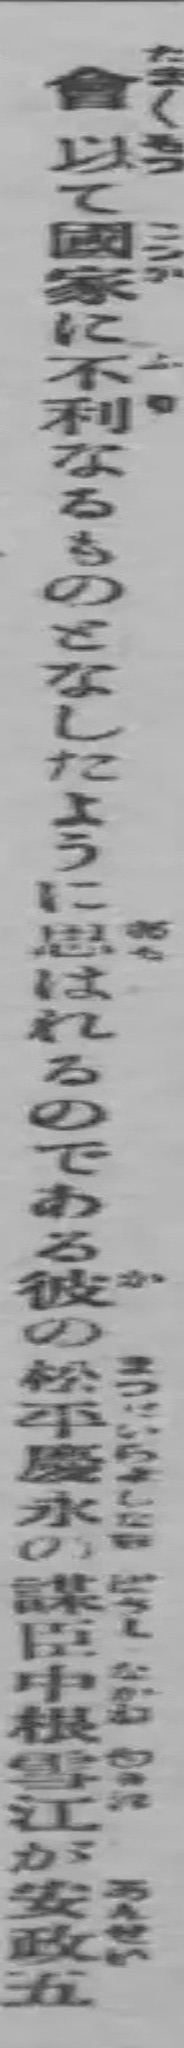会以て国家に不利なるものとなしたように思はれるのである彼の松平慶永の謀臣中根雪江が安政五
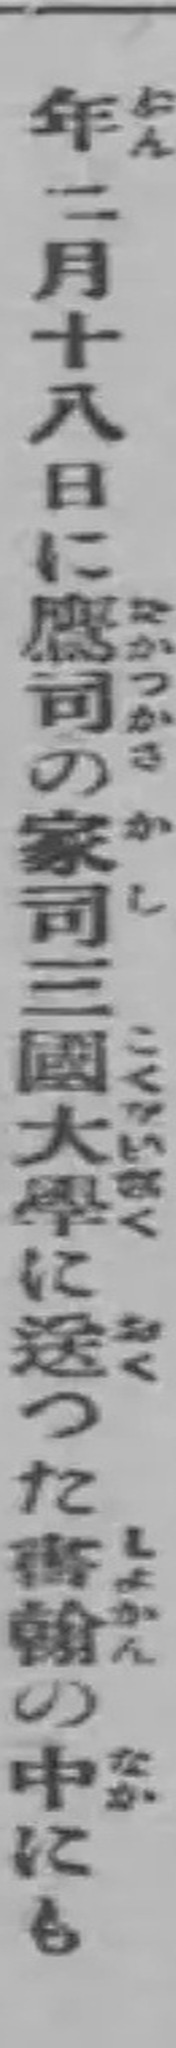年二月十八日に鷹司の家司三国大学に送つた書翰の中にも
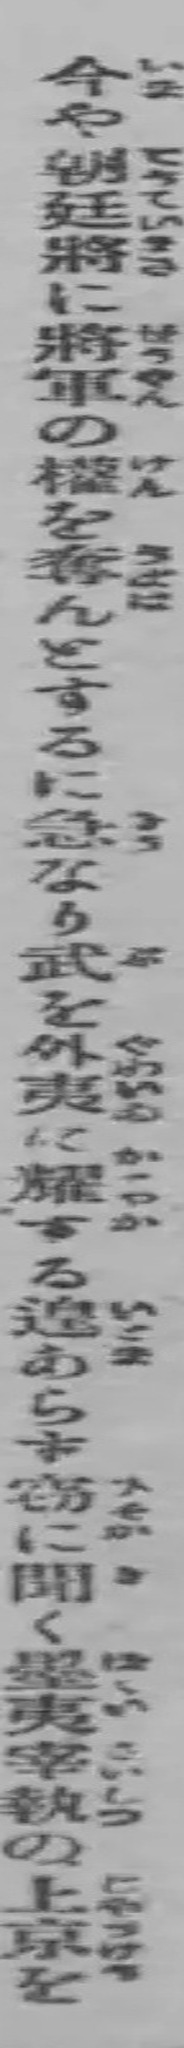今や朝廷将に将軍の権を奪んとするに急なり武を外夷に耀する遑あらず窃に聞く墨夷宰執の上京を
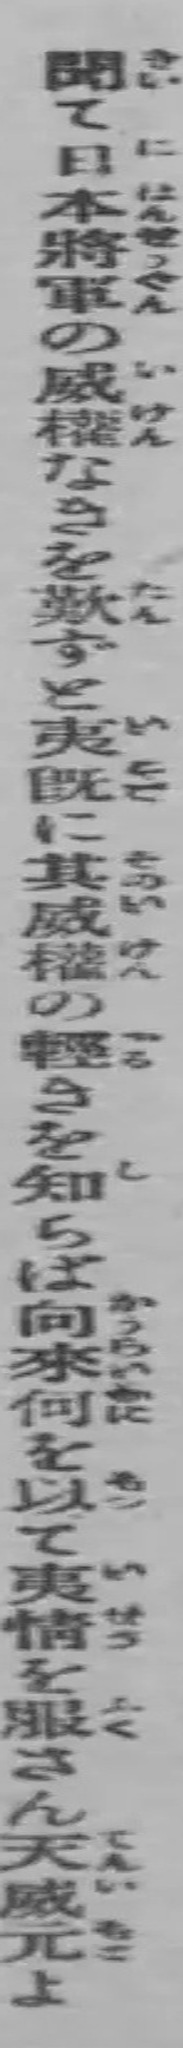聞て日本将軍の威権なきを歎ずと夷既に其威権の軽きを知らば向来何を以て夷情を服さん天威元よ
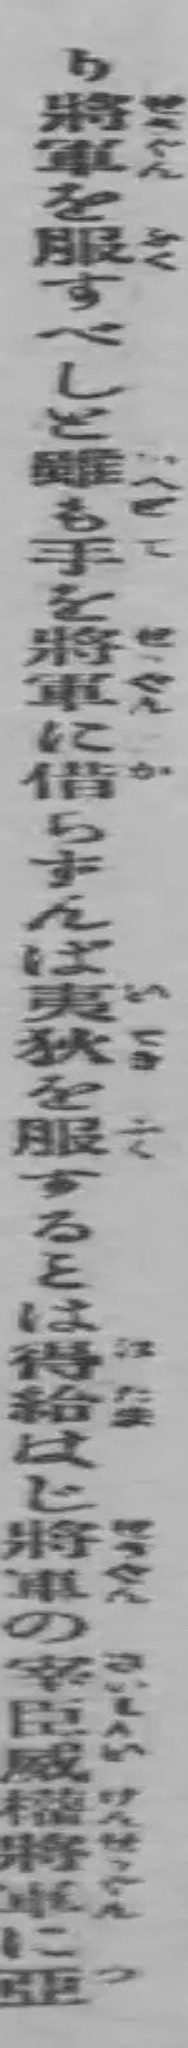り将軍を服すべしと雖も手を将軍に借らずんば夷狄を服することは得給はじ将軍の宰臣威権将軍に亜
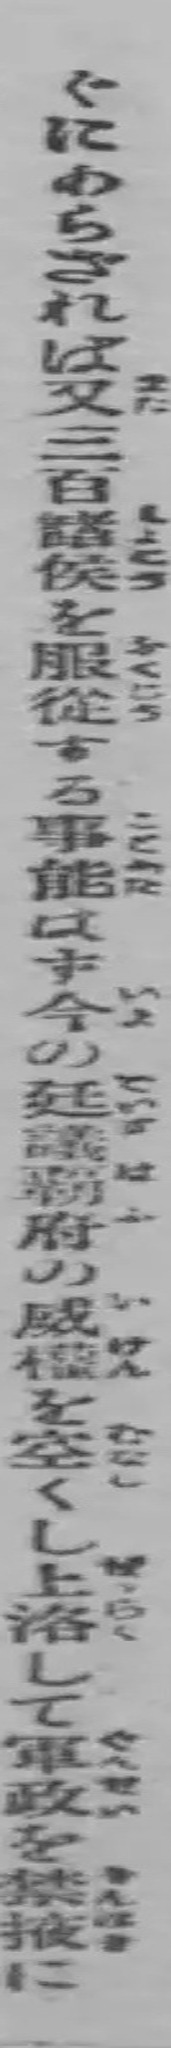ぐにあらざれば又三百諸侯を服従する事能はず今の廷議覇府の威権を空くし上洛して軍政を禁掖に
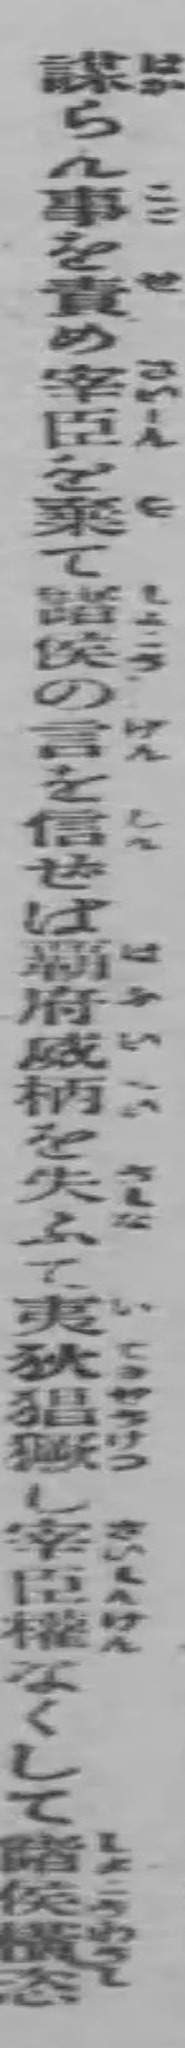謀らん事を責め宰臣を棄て諸侯の言を信ぜば覇府威柄を失ふて夷狄猩獗し宰臣権なくして諸侯横恣
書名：豊橋市史談
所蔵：国立国会図書館 National Diet Library, JAPAN
